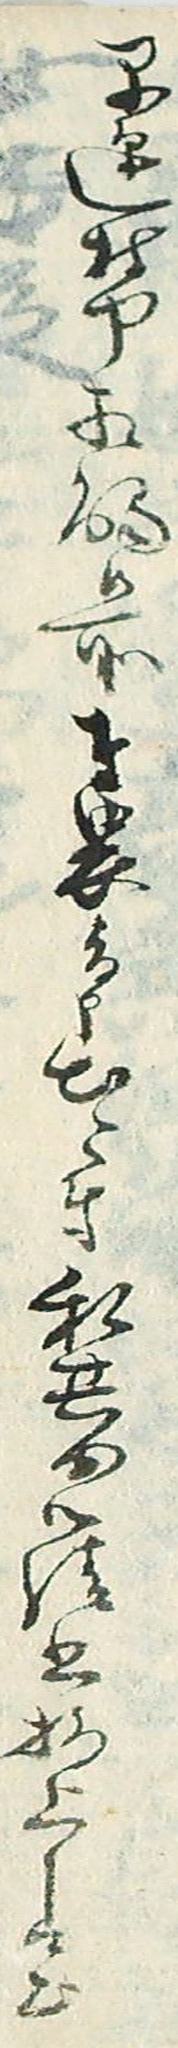早速村中相触候所奉畏旨申出候に付私共ゟ御請書指上申候以上
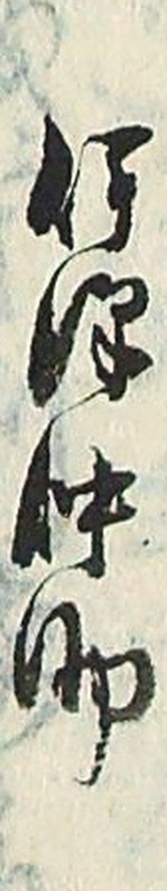伊澤仲助
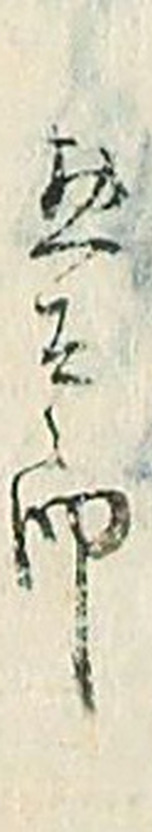惣太郎
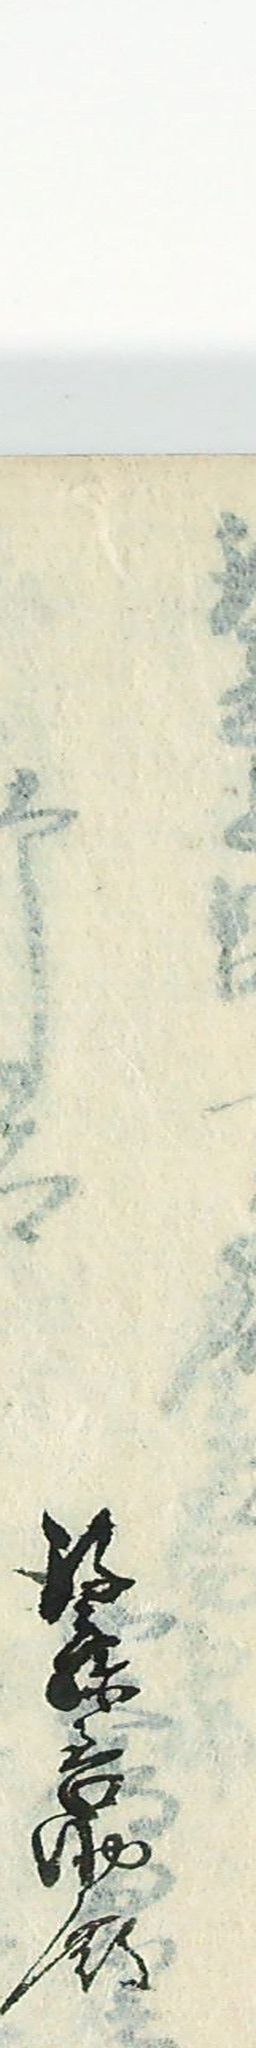後藤善助殿
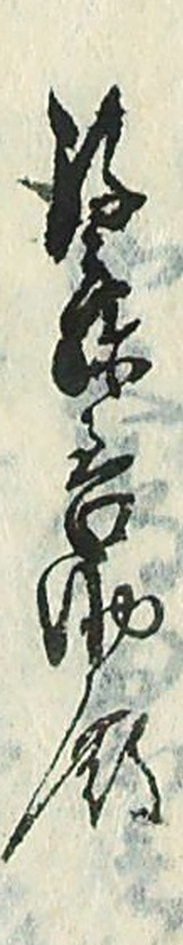後藤善助殿
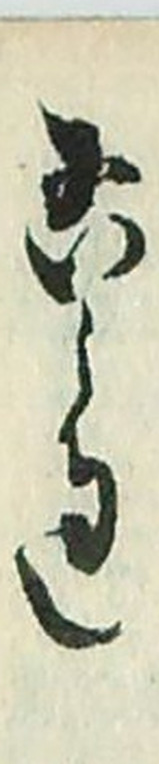右之通
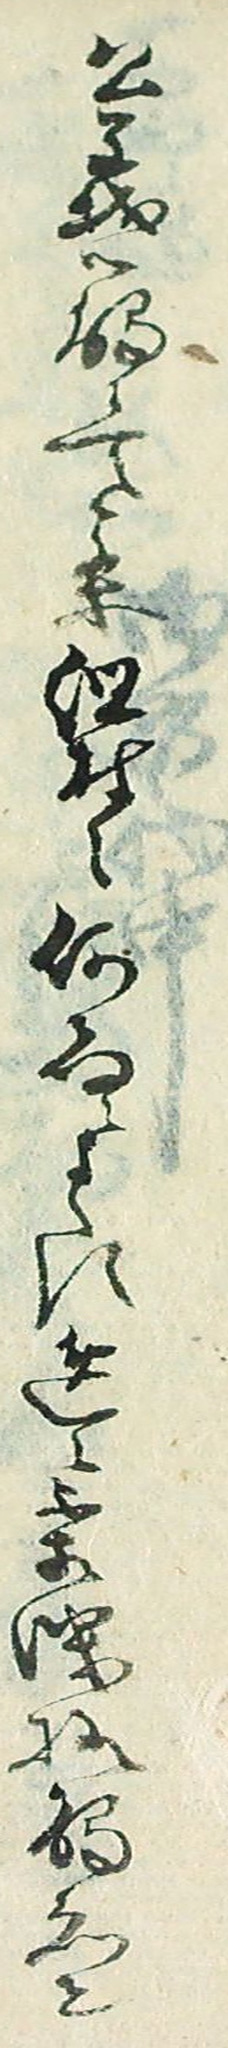公義御触有之候条組村々何者によらす逸々相不洩様触知せ
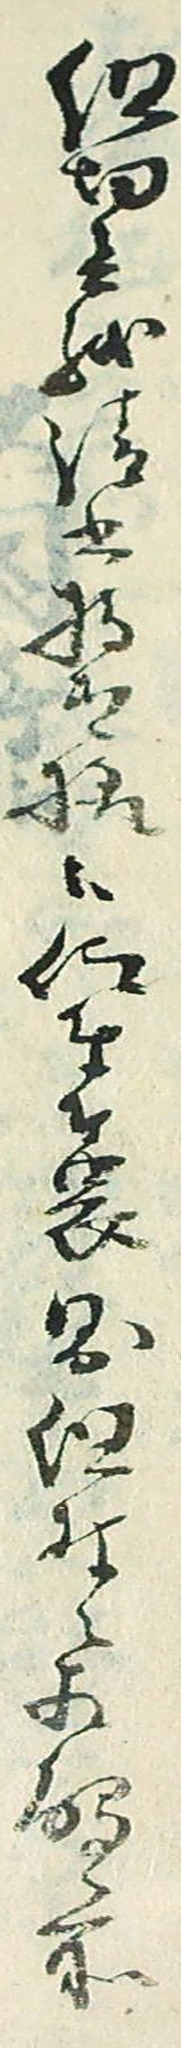組切壱紙請書指出候様被仰付奉畏則組村々相触候所
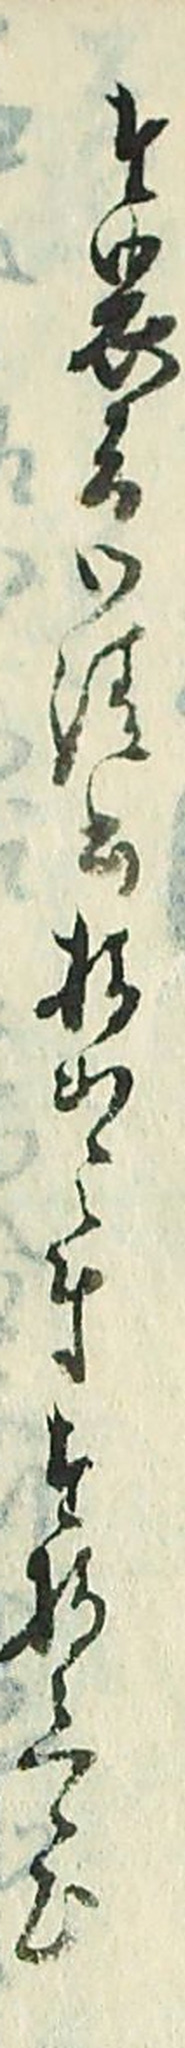奉畏旨御請書指出候に付奉指上候以上
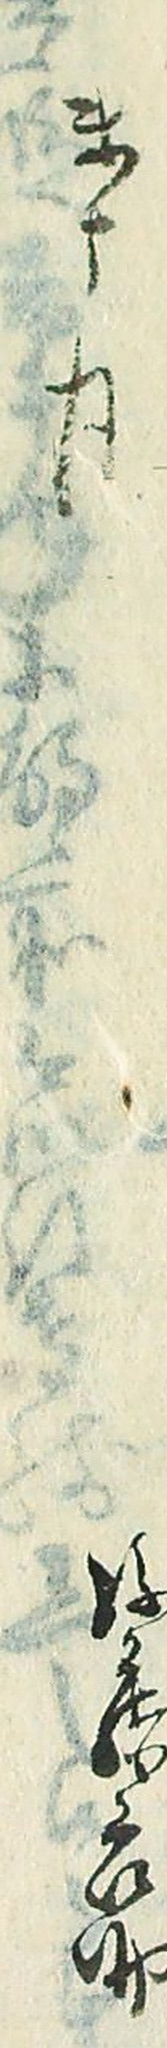未十月後藤善助
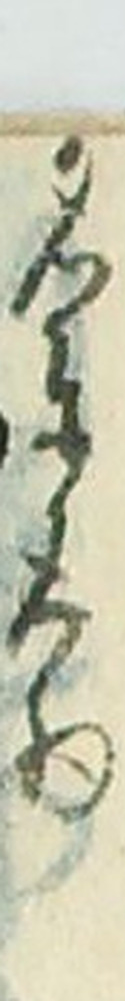名東名西
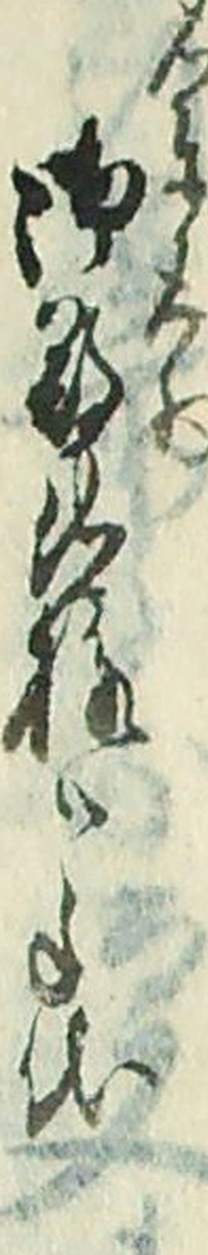御郡代様御手代
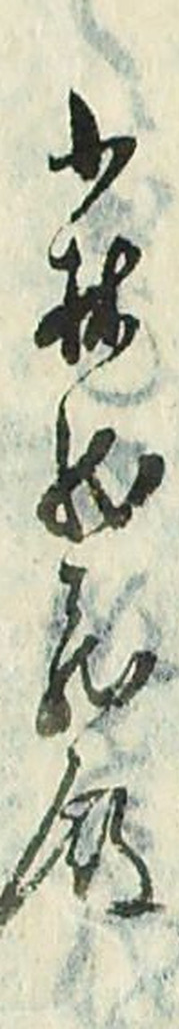小林龍蔵殿

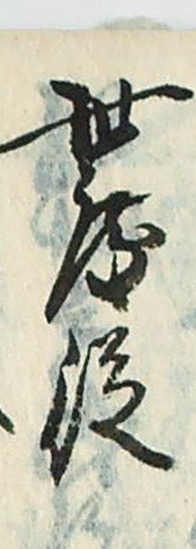此度従
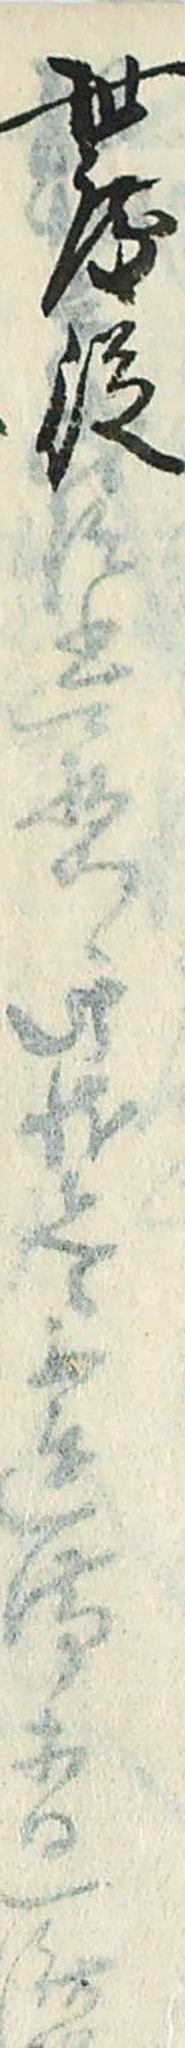此度従
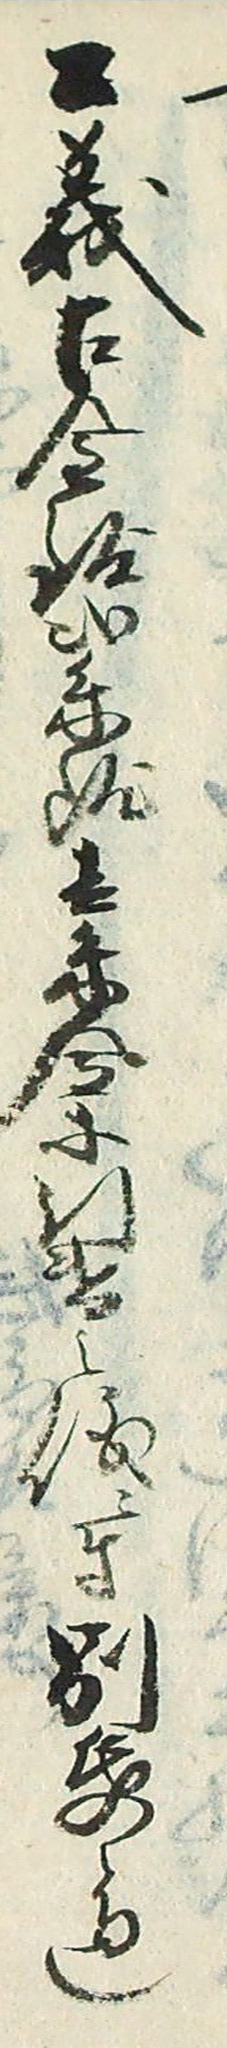公義古金銀弐朱銀壱朱金等引替之儀に付別帋之通
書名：諸御用御□受書控
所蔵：鳴門教育大学 Naruto University of Education
